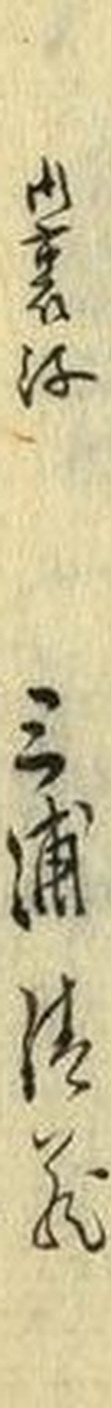御裏役三浦清蔵
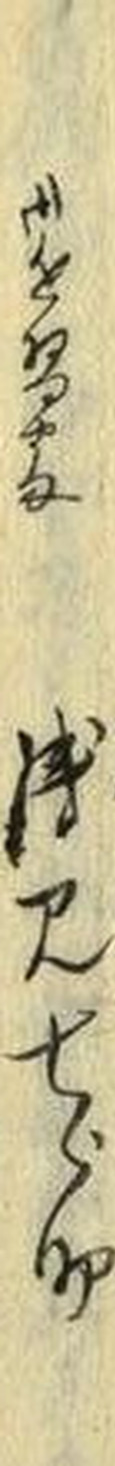御近習番浅見七郎助
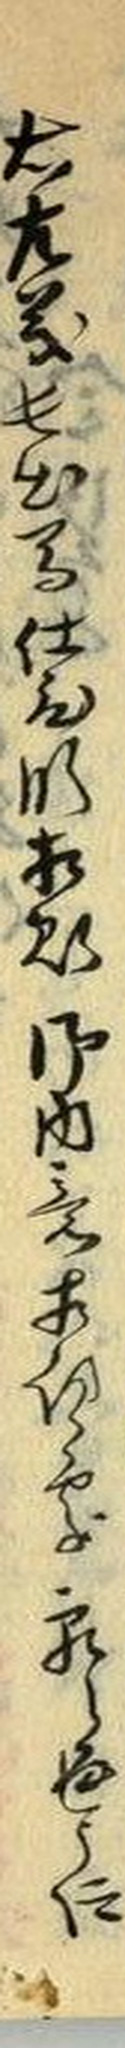右左義長出馬仕度段相願御内意相伺候処願之通被仰
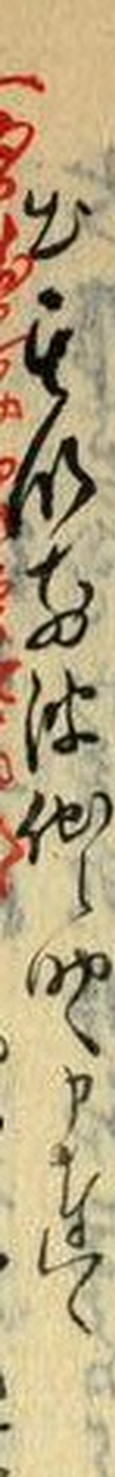出其段前波他之助へ申達候
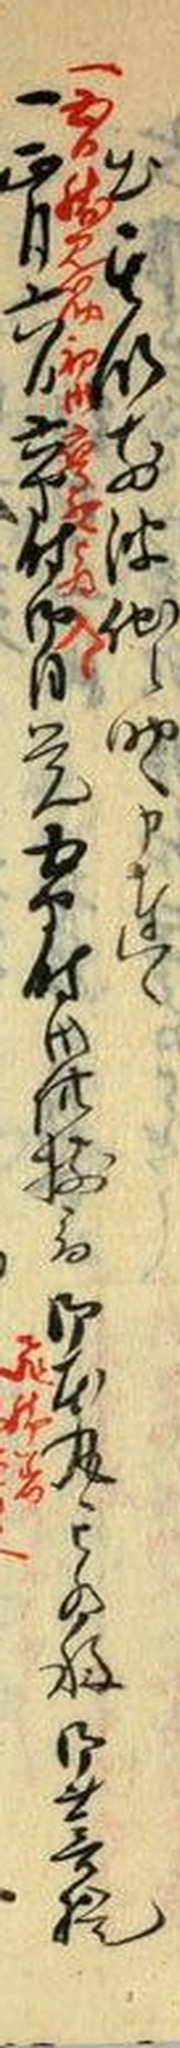一正月六日六半時御目覚五半時御供揃ニ而御本丸へ被為移御菩提
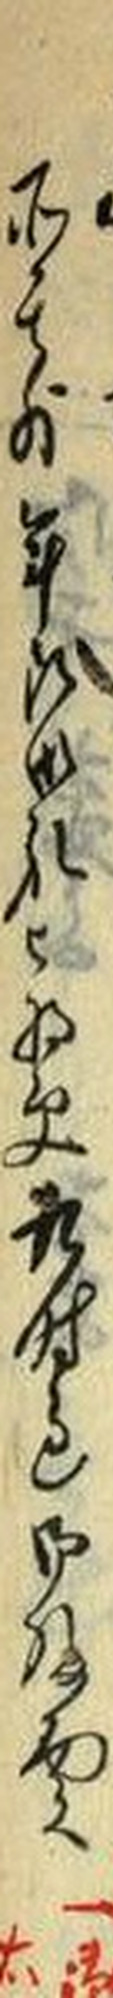所其外年頭御礼被為受九時過御帰殿
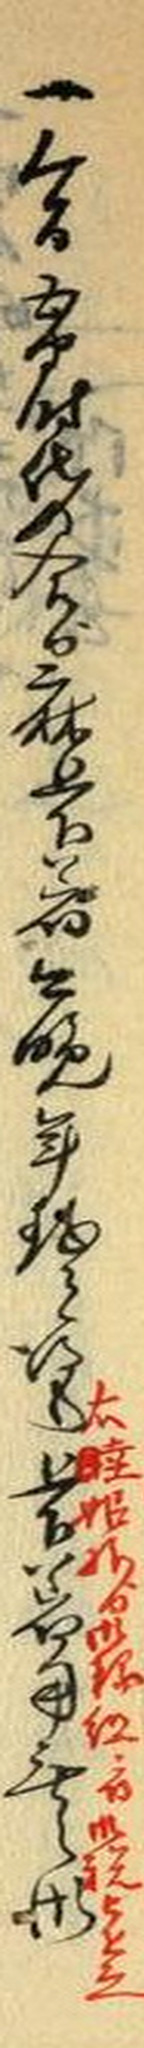一今日五半時代り合ゟ麻上下着今晩年越ニ候得共上下着用無之御
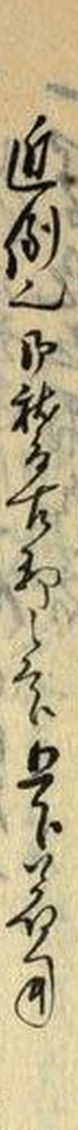近例也御稽古初之節上下着用
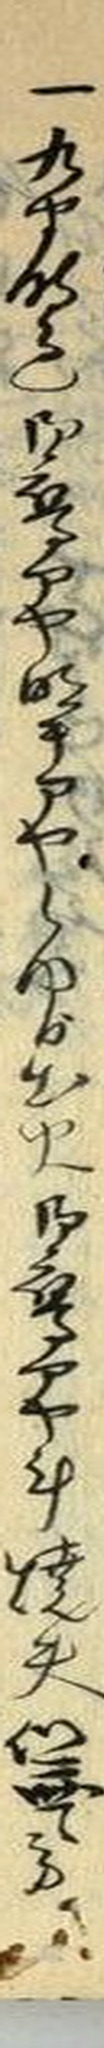一九半時過御鷹部や明キ部や之内ゟ出火御鷹部や斗焼失但西之方
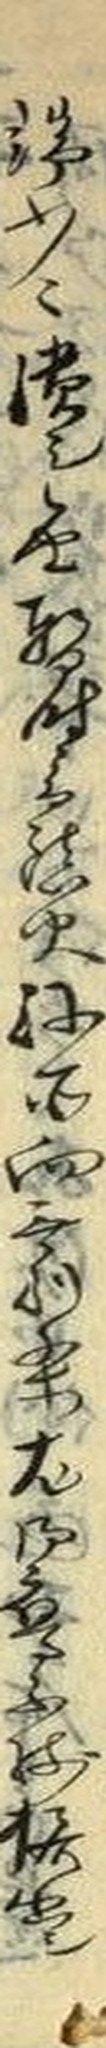端少々潰シ候由暫時ニ而鎮火役所向無別条尤御鷹不残据出シ
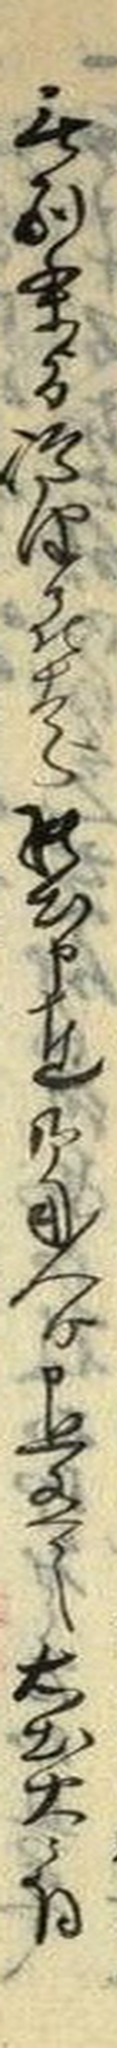無別条旨嶋津喜太郎罷出申達御用人ゟ申上有之右出火ニ付
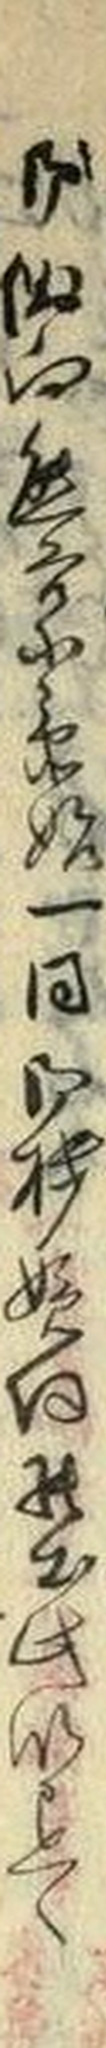御側向熊谷小兵衛始一同御機嫌伺罷出此段申上候
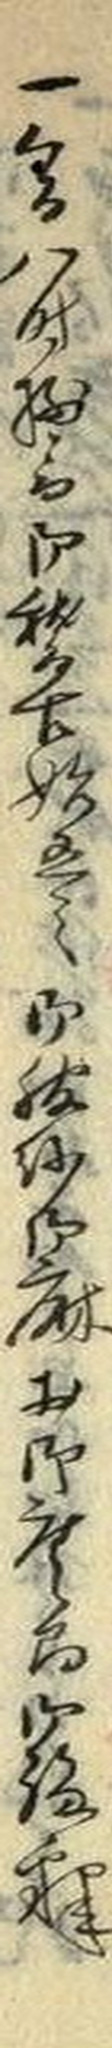一今日八時揃ニ而御稽古始有之御服紗御麻於御座之間御講釈
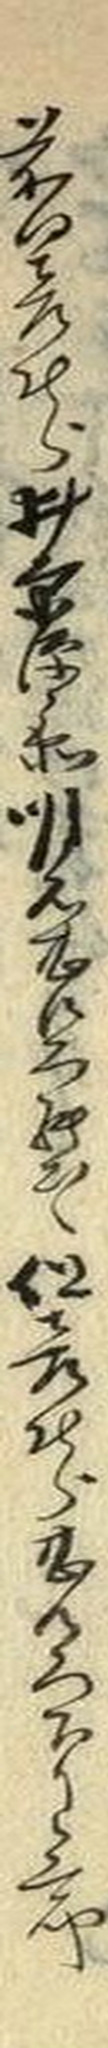前田彦次郎井原源兵衛明石甚左衛門罷出候但彦次郎甚左衛門下り候節
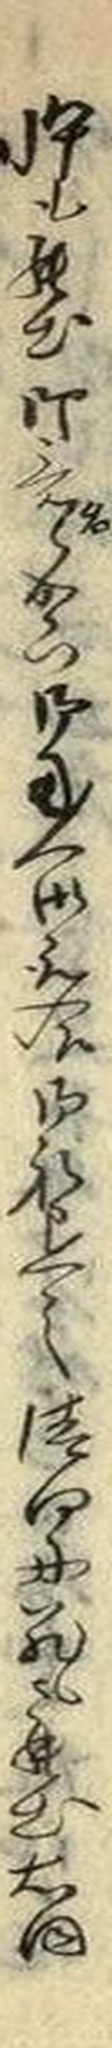忰も罷出御意名被成下御用人御取合御礼申上之清田丹蔵も罷出右同
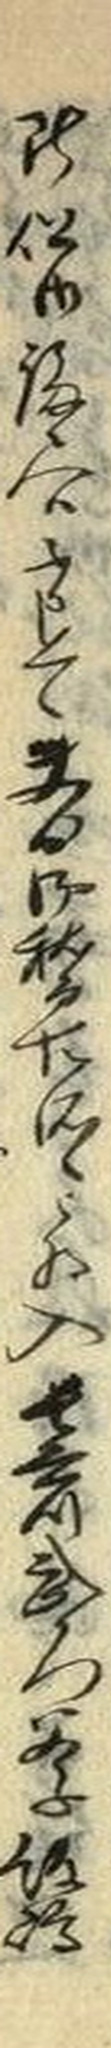断但御講尺ハ不申上候夫ゟ御稽古所へ被為入長谷川武右衛門父子飯嶋
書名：少傅日録抄（斉承付側向頭取日記、在国）
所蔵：福井県文書館 Fukui Prefectural Archives
